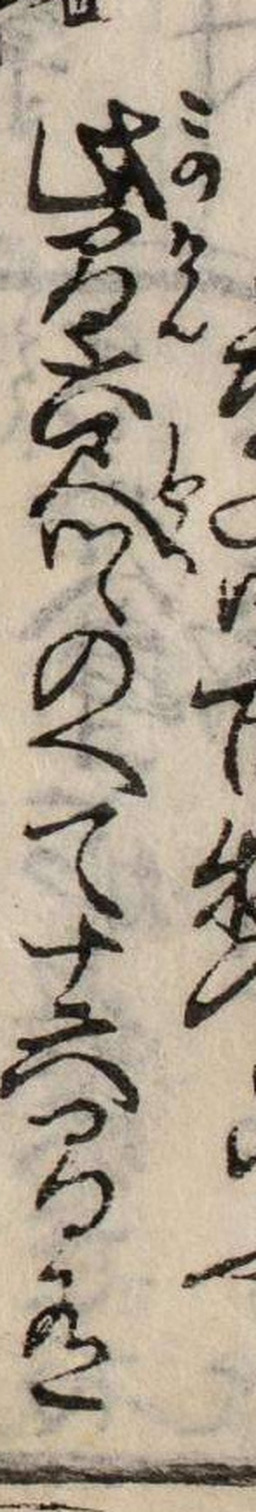此間六尺つゝのへて十六間有
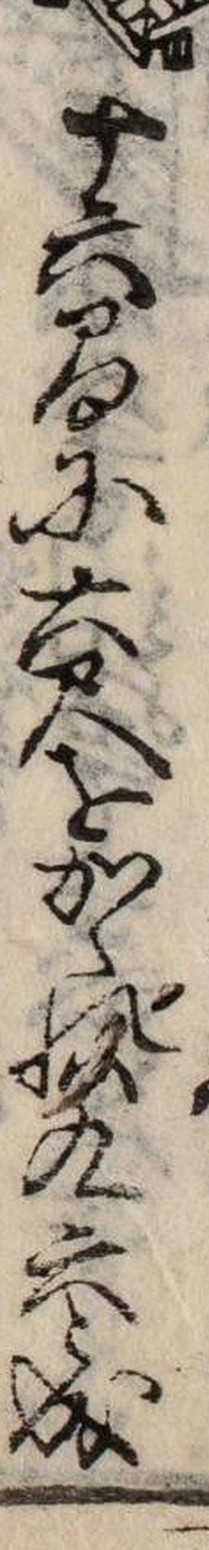十六間に六尺をかくれは九六と成
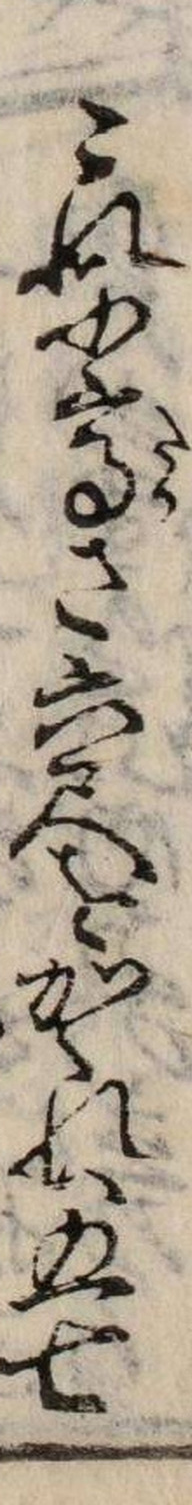これに高さ六尺をかくれは五七
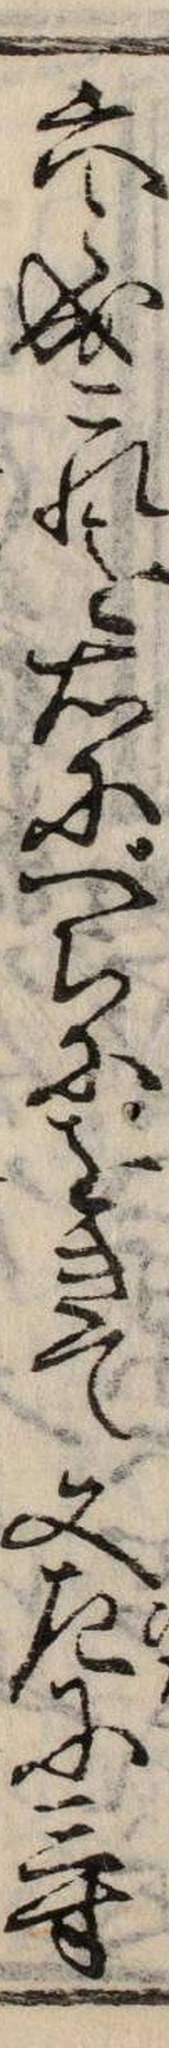六と成これを右にべちにをきて又左に三寸
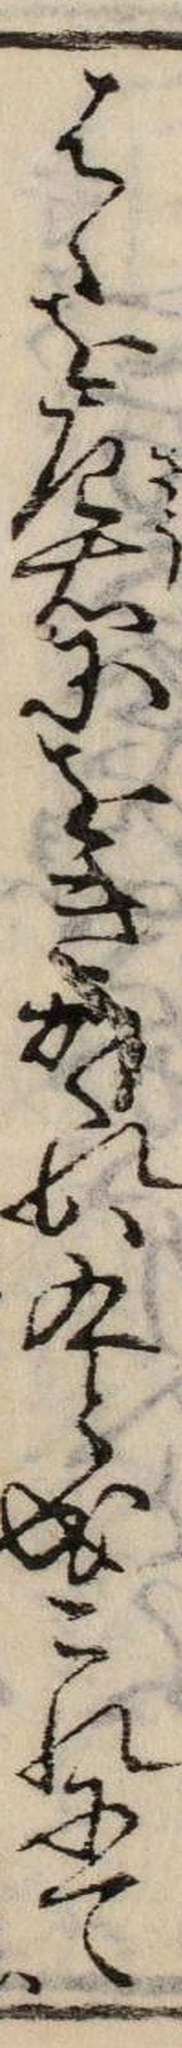はくを左右にをきかくれは九と成これにて
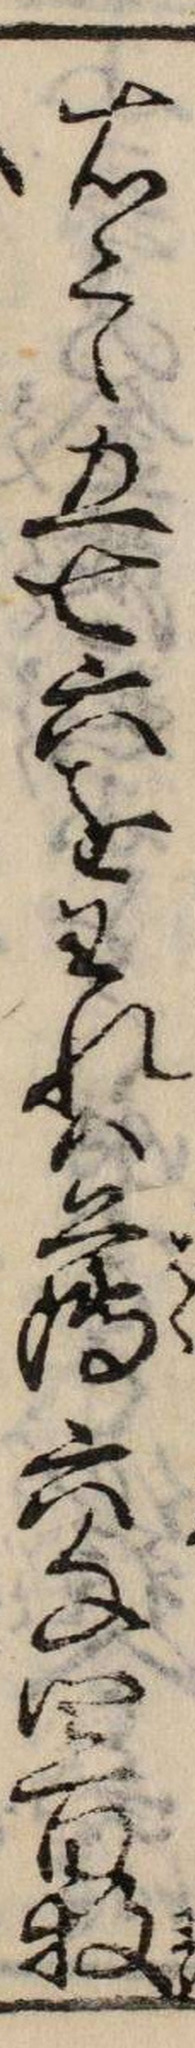右の五七六をわれは薄六千四百枚
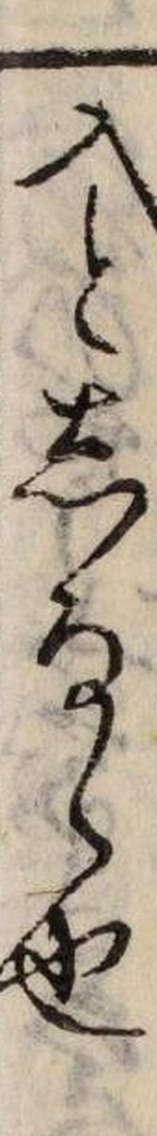入としるゝ也
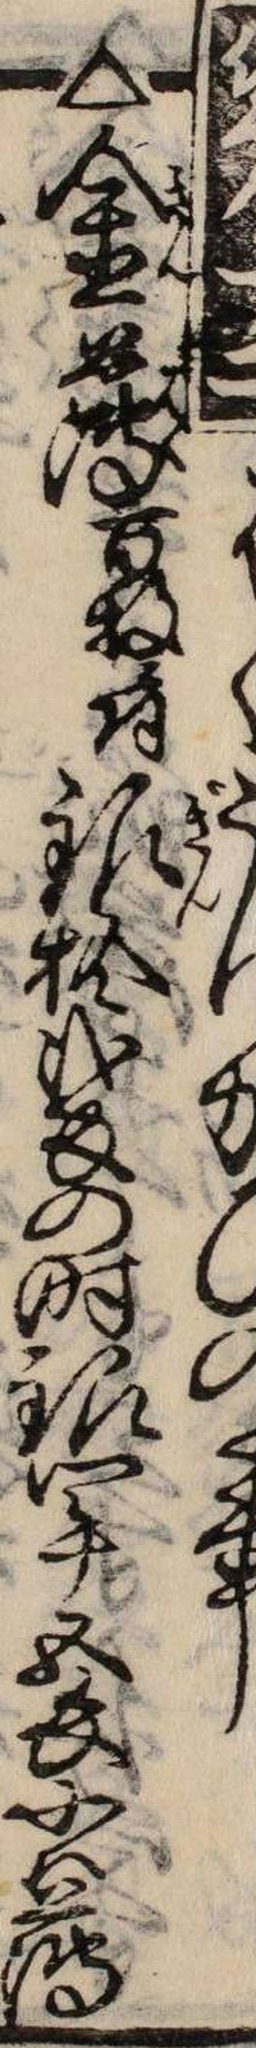△金薄百枚に付銀拾弐匁の時銀四十五匁には薄
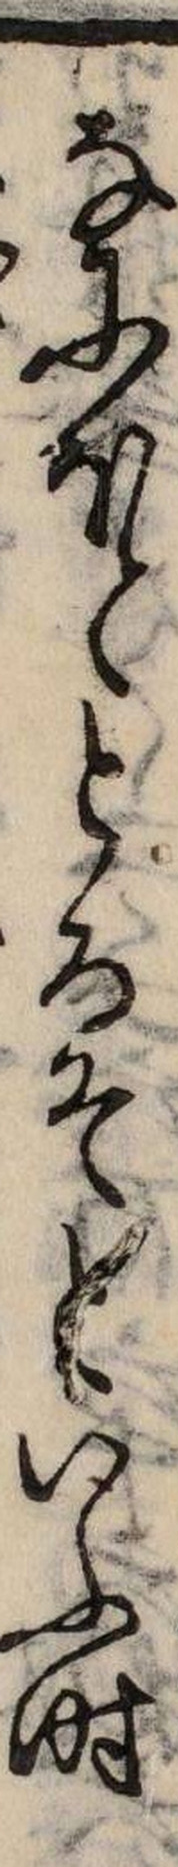なにほととるそといふ時
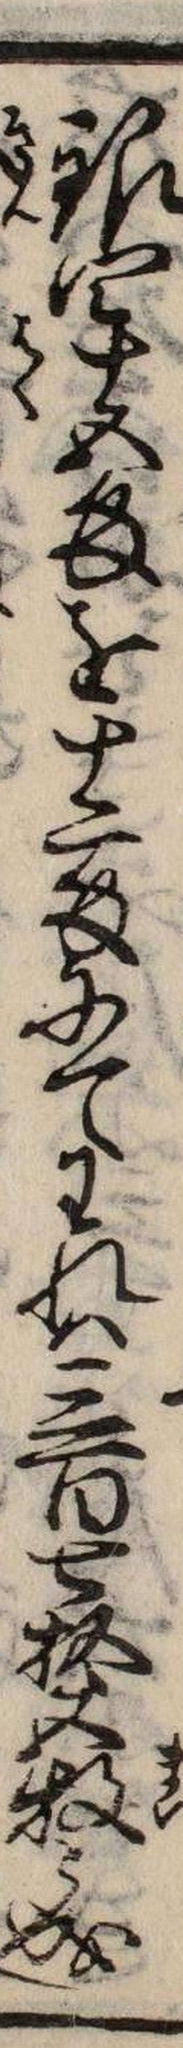銀四十五匁を十二匁にてわれは三百七拾五枚と成也
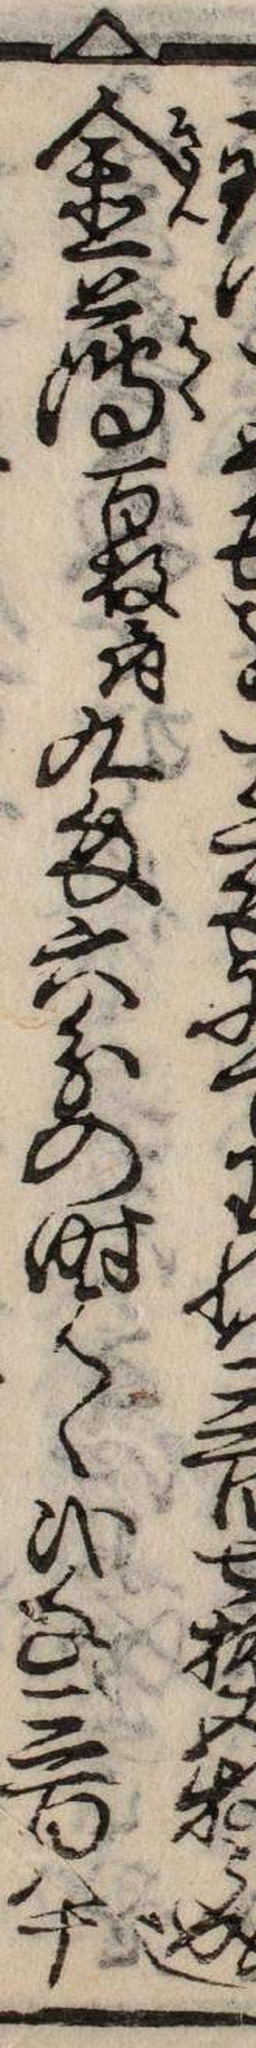△金薄百枚に付九匁六分の時はく弐千三百八十
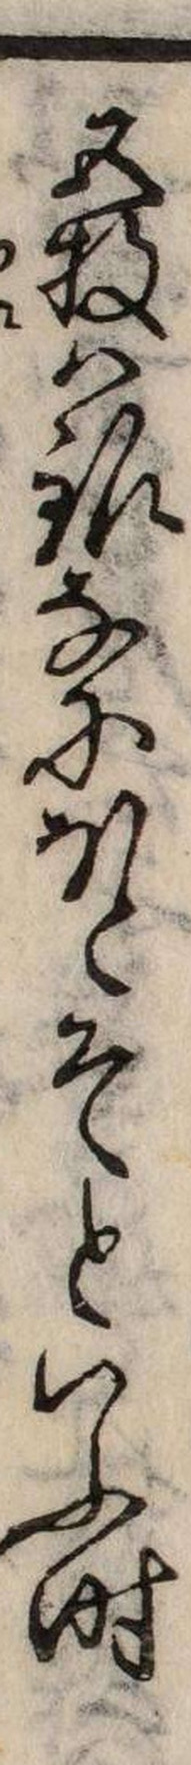五枚は銀なにほとそといふ時
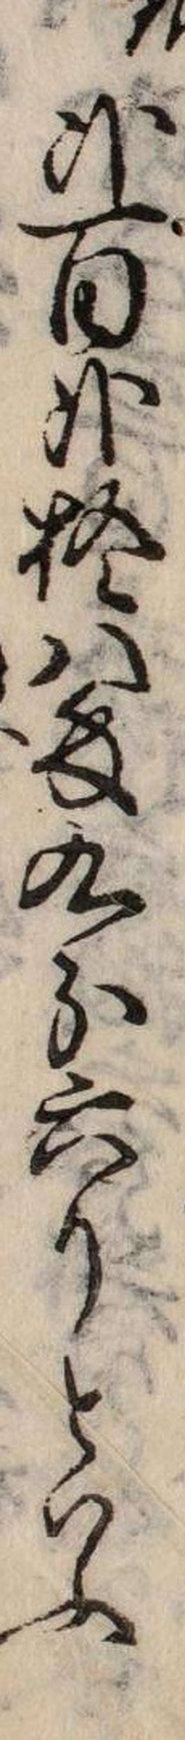銀弐百弐拾八匁九分六りといふ
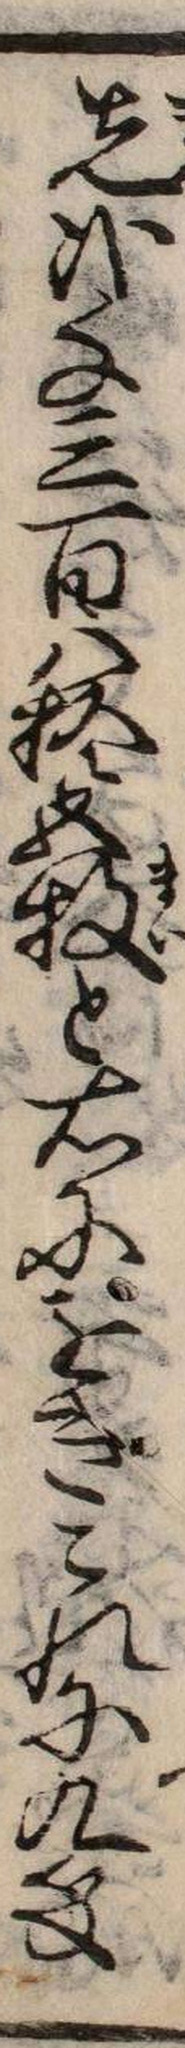先弐千三百八拾五枚と右にをきこれに九匁
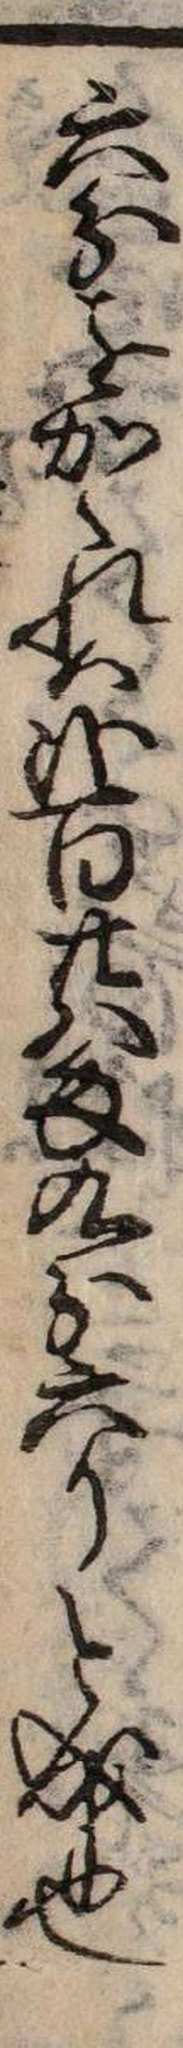六分をかくれは弐百廿八匁九分六りと成也

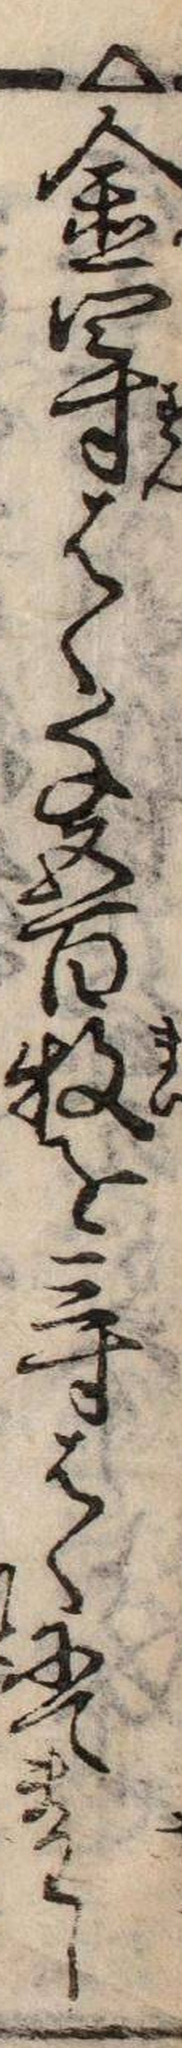△金四寸はく千五百枚を三寸はくにてまわし
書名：塵劫記（寛永11年自跋、京都府立京都学・歴彩館追貴8）
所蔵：京都府立京都学・歴彩館 国文学研究資料館
